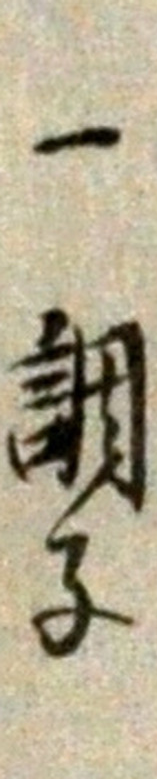一調子
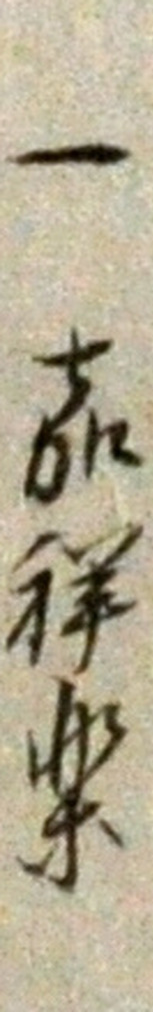一嘉祥楽
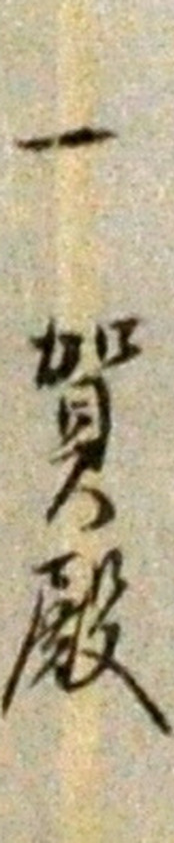一賀殿
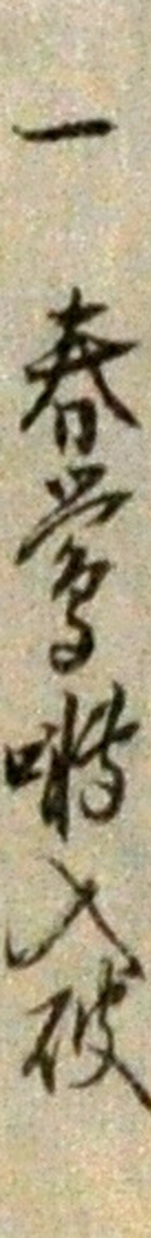一春鶯囀入破
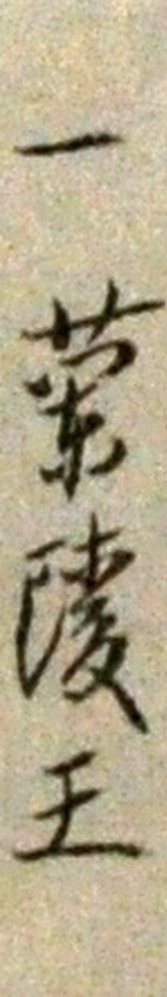一蘭陵王
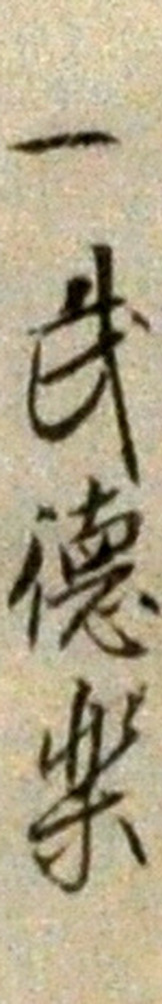一武徳楽
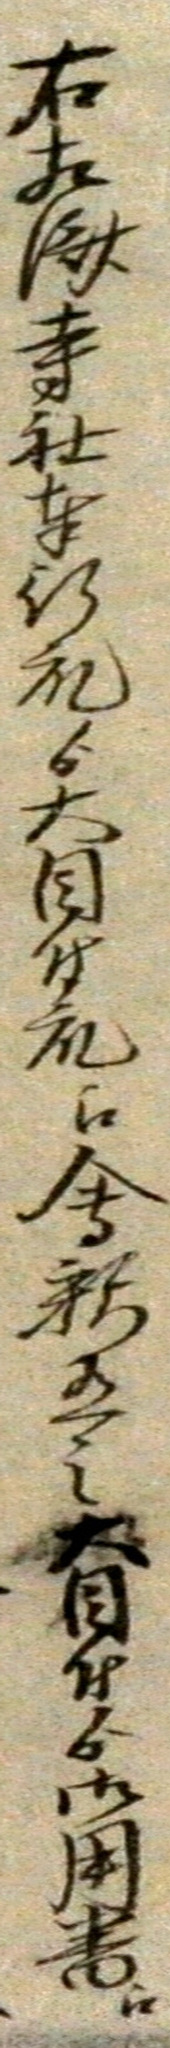右相済寺社奉行衆ゟ大目付衆え会釈有之大目付ゟ御用番え
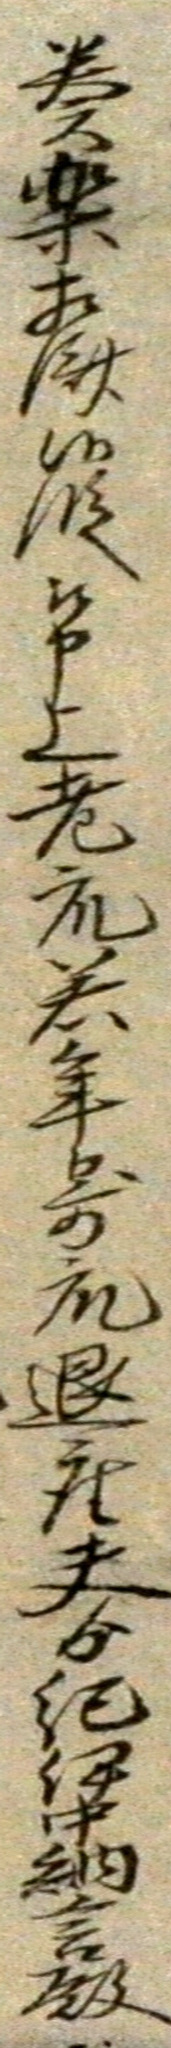奏楽相済候段被申上老衆若年寄衆退座夫ゟ紀伊中納言殿
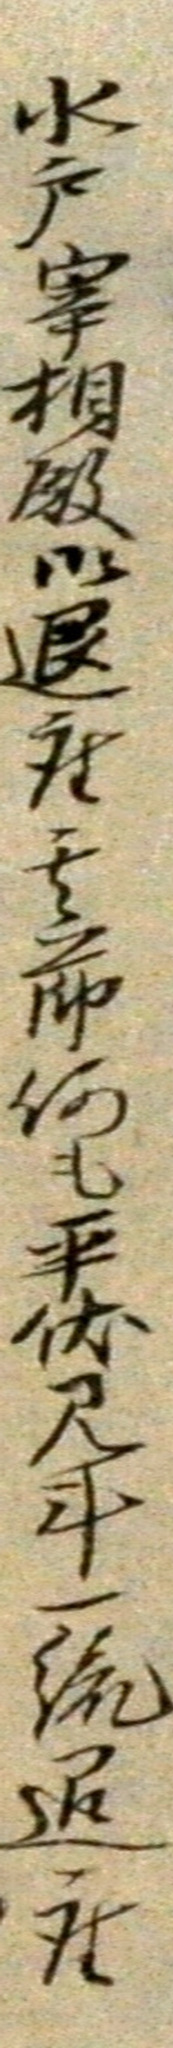水戸宰相殿御退座其節何も平伏見計一統退座
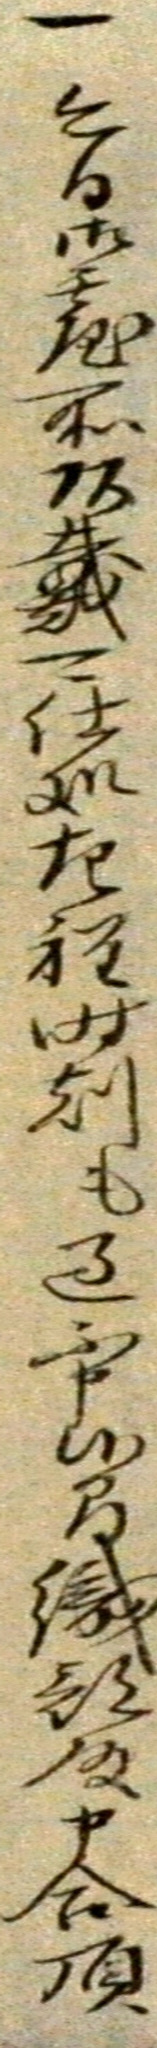一今日御台所頂戴可仕処左程時刻も過不申候間織部殿申合頂
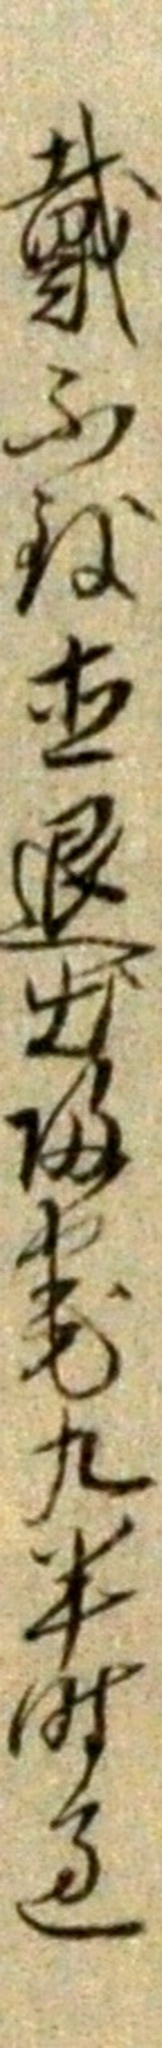戴不致直退出帰宅九半時過
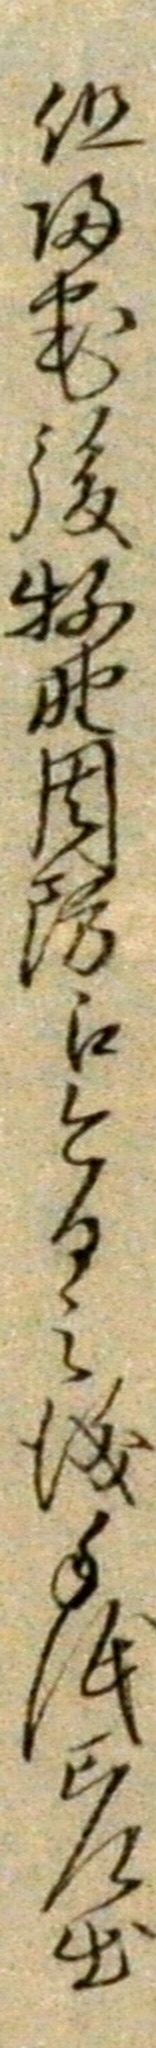但帰宅後牧野周防え今日之儀手紙差出
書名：奏楽聴聞致シ候節ノ留
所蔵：伊那市立高遠町図書館・合同会社AMANE
